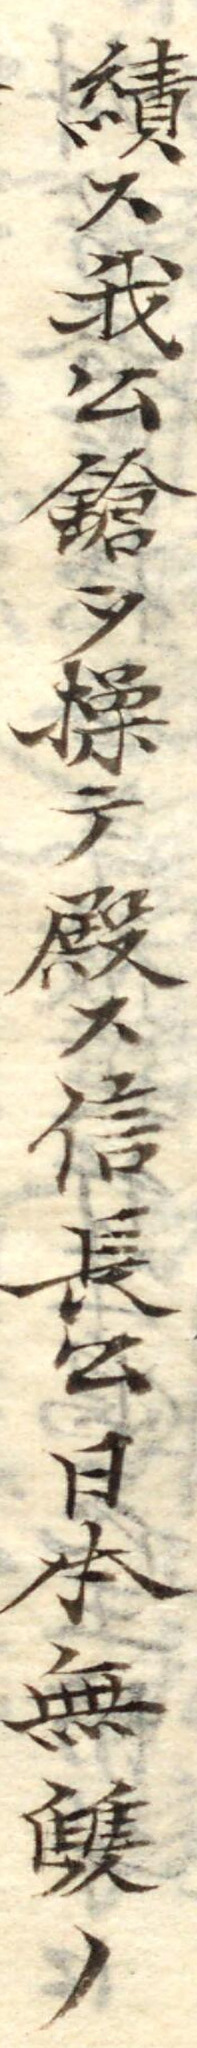績す我公鎗を操て殿す信長公日本無雙の
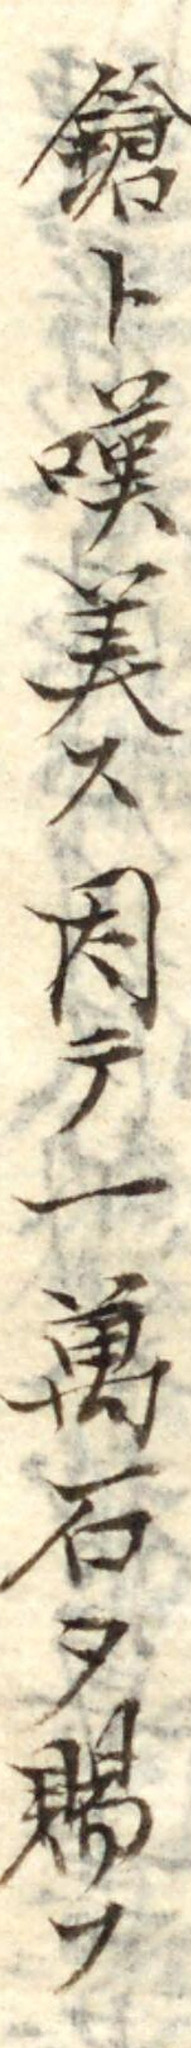鎗と嘆美す因て一万石を賜ふ
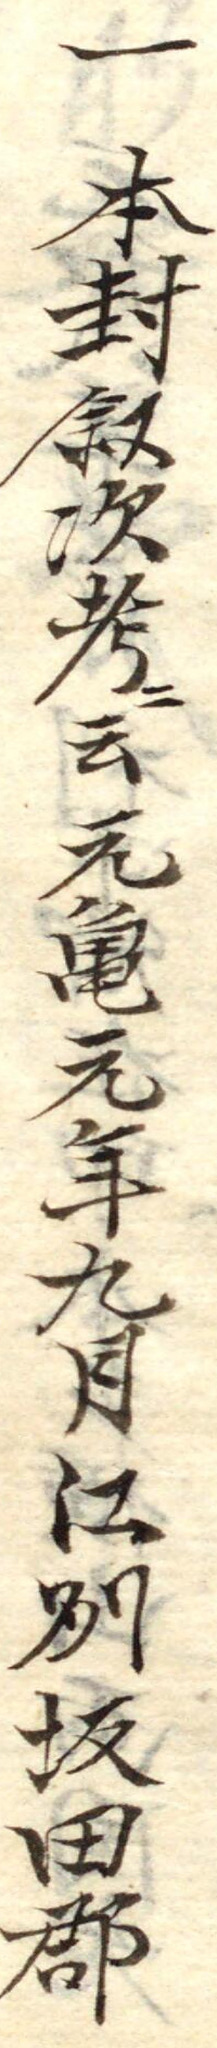一本封叙次考に云元亀元年九月江州坂田郡
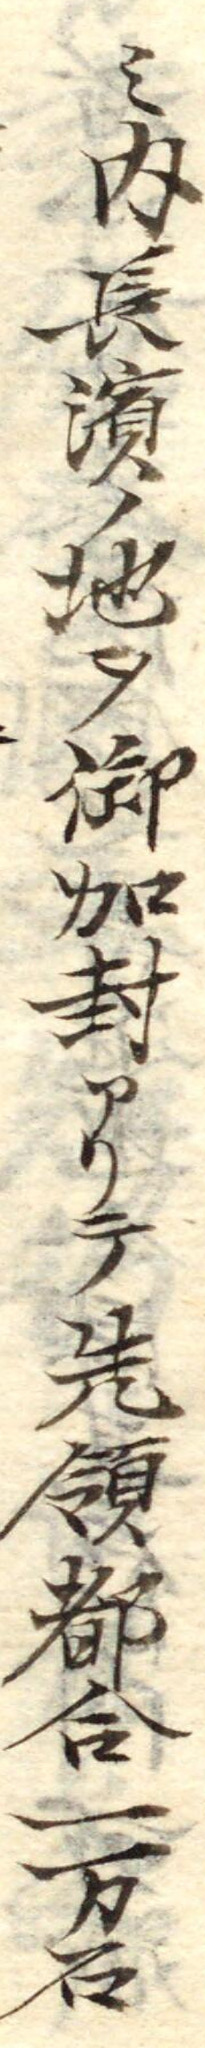之内長浜の地を御加封ありて先領都合一万石
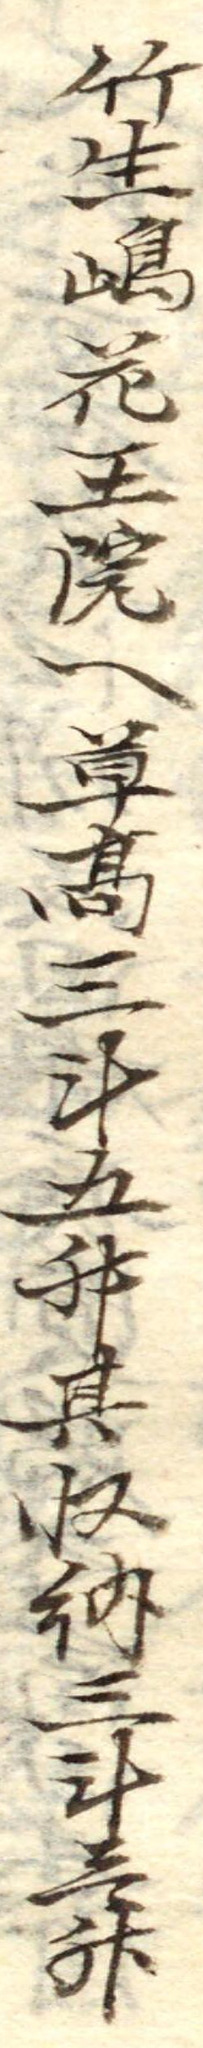竹生島花王院へ草高三斗五升其収納三斗三升
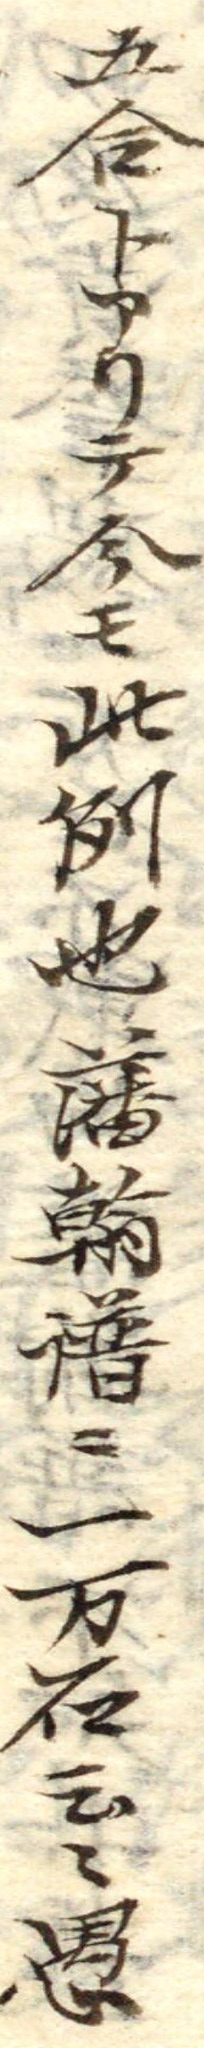五合とありて今も此例也藩翰譜に一万石云々愚
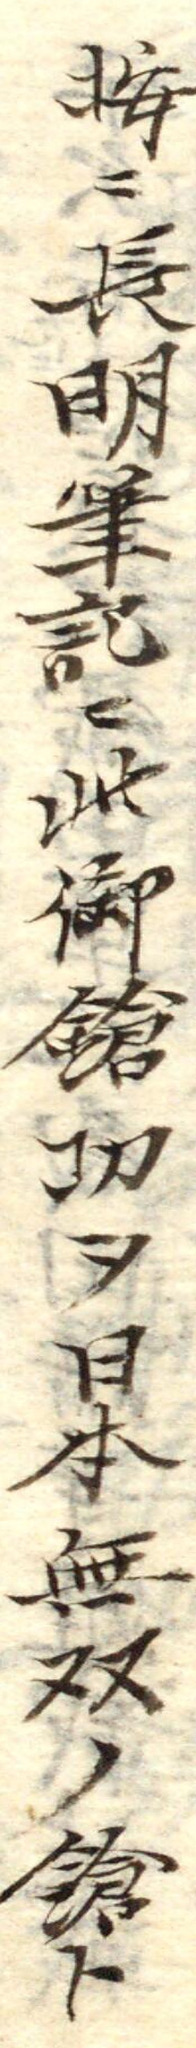按に長明筆記に此御鎗功を日本無双の鎗と
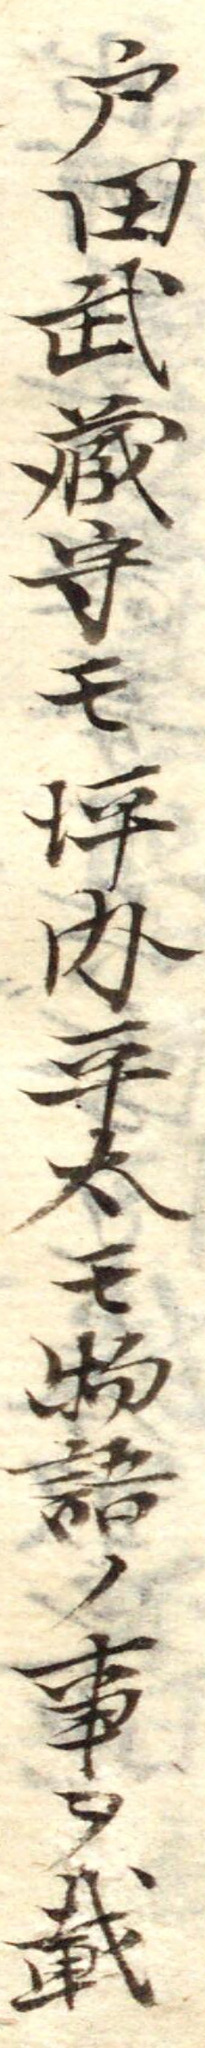戸田武蔵守も坪内平太も物語の事を載

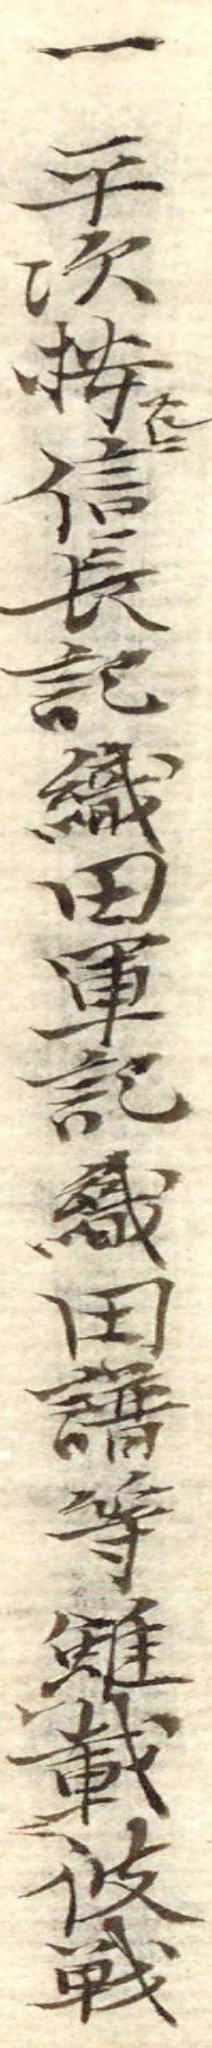一平次按なるに信長記織田軍記織田譜等雖載彼戦
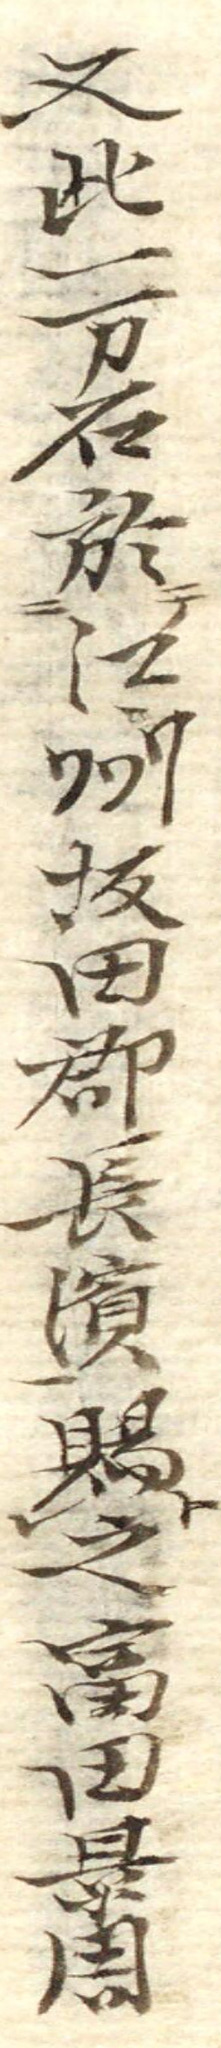又此一万石於て江州坂田郡長浜賜と之富田景周
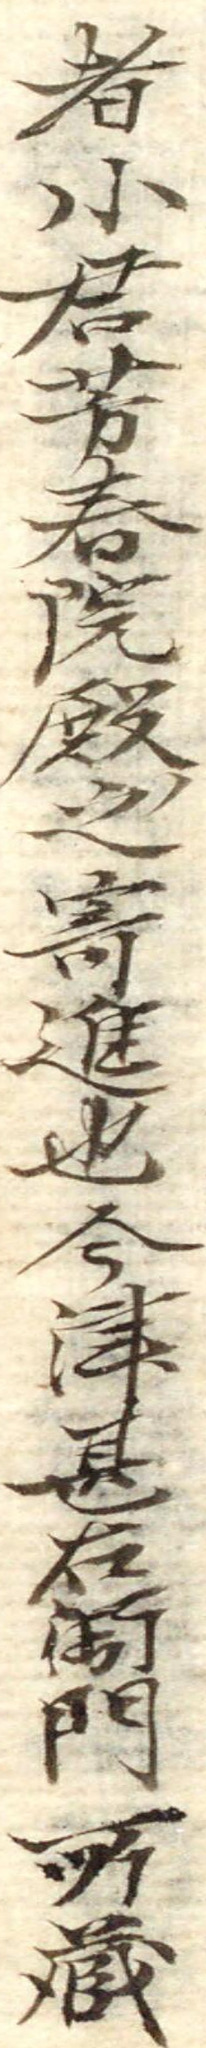者小君芳春院殿之寄進也今津甚右衛門所蔵
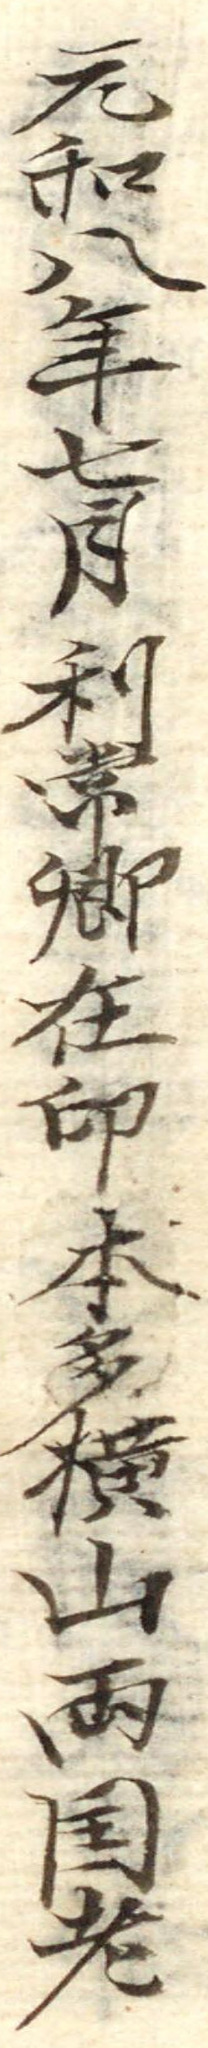元和八年七月利常卿在印本多横山両国老
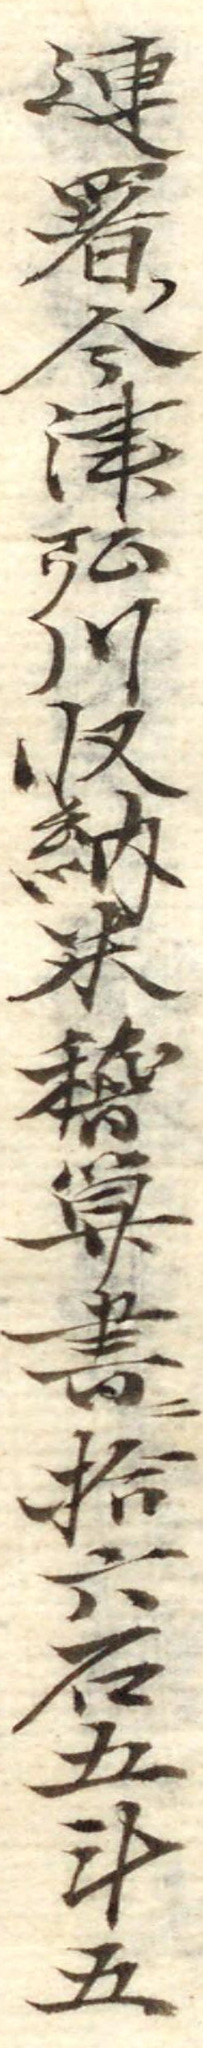連署の今津弘川収納米稽算書に拾六石五斗五
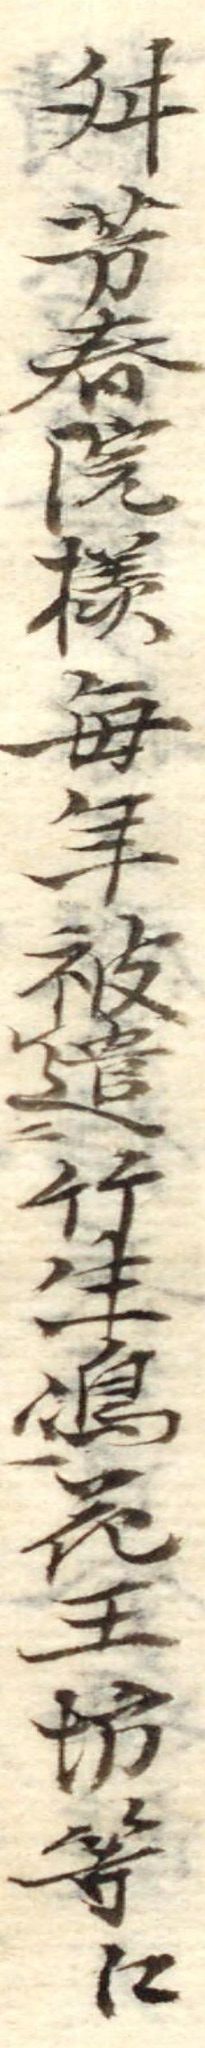升芳春院様毎年被遣竹生島花王坊等江
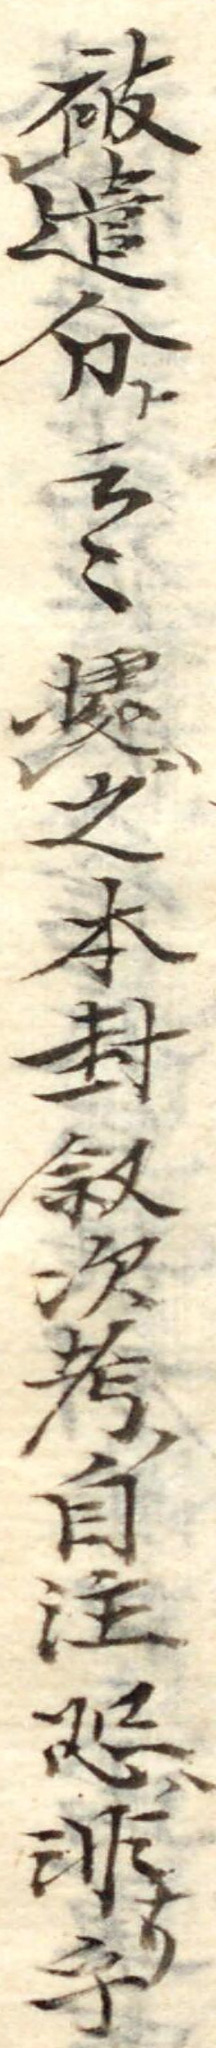被遣分と云々據は之本封叙次考の自注恐は非なり乎
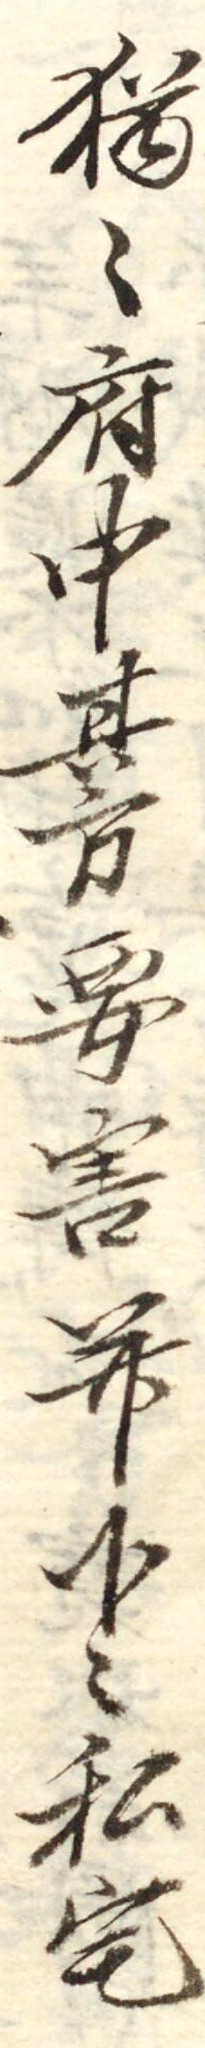猶々府中其方要害幷下々私宅
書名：前田家封国証書集録
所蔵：Ishikawa Prefectural Library
